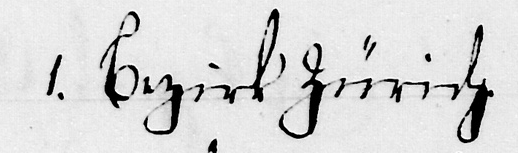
1. Bezirk Zürich.
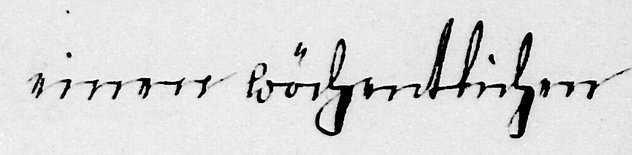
einen wöchentlichen
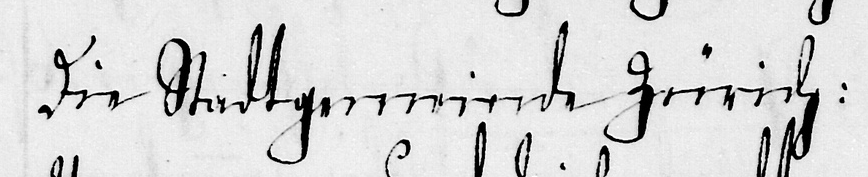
Die Stadtgemeinde Zürich:
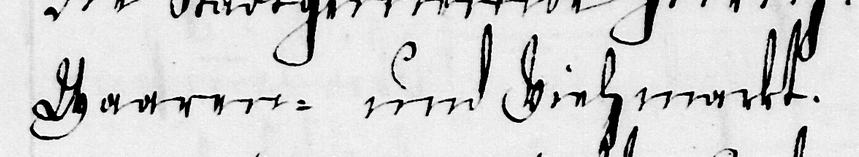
Waaren- und Viehmarkt.
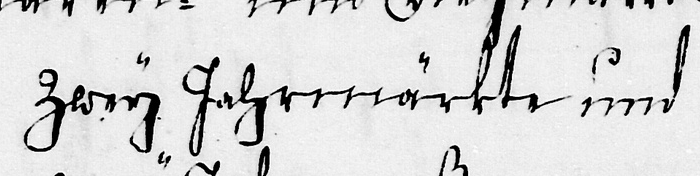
Zwey Jahrmärkte und
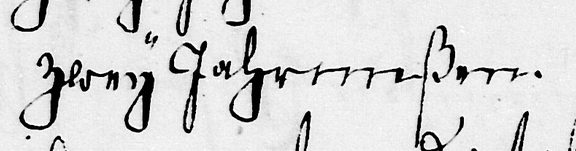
zwey Jahrmeßen.
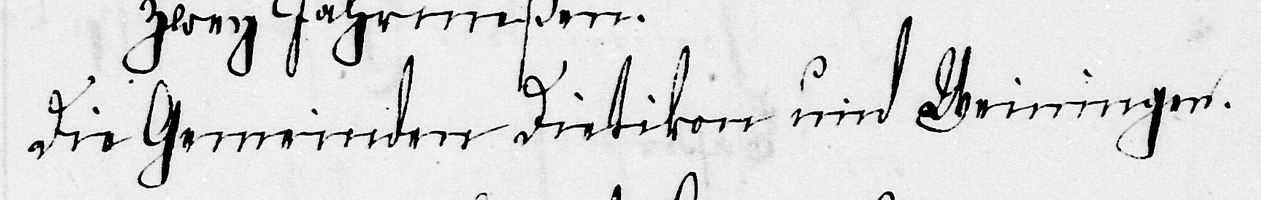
Die Gemeinden Dietikon und Weiningen.
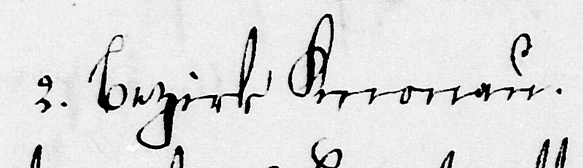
2. Bezirk Knonau.
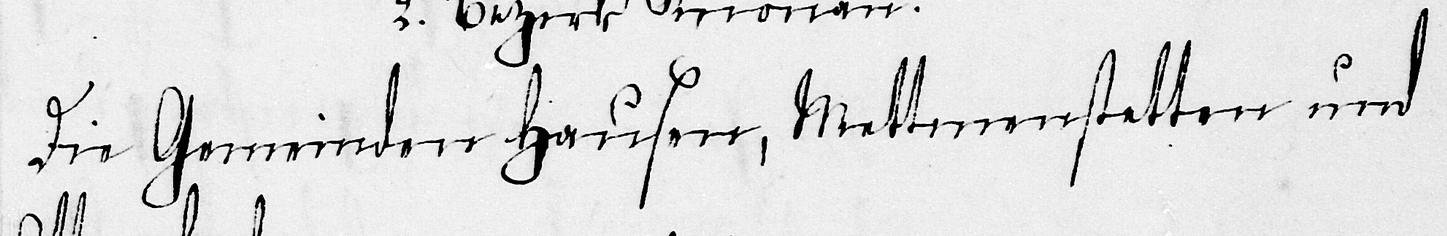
Die Gemeinden Hausen, Mettmenstetten und
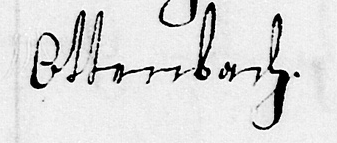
Ottenbach.
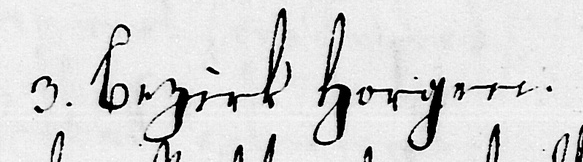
3. Bezirk Horgen.
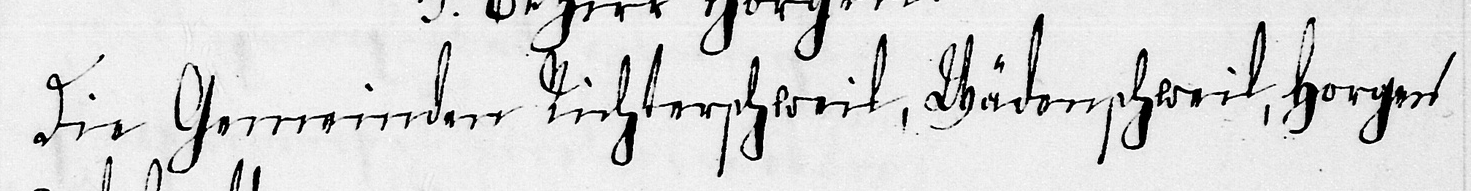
Die Gemeinden Richterschweil, Wädenschweil, Horgen
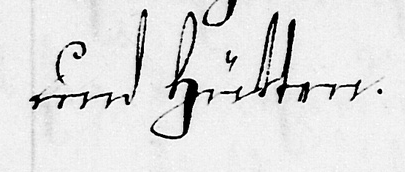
und Hütten.
